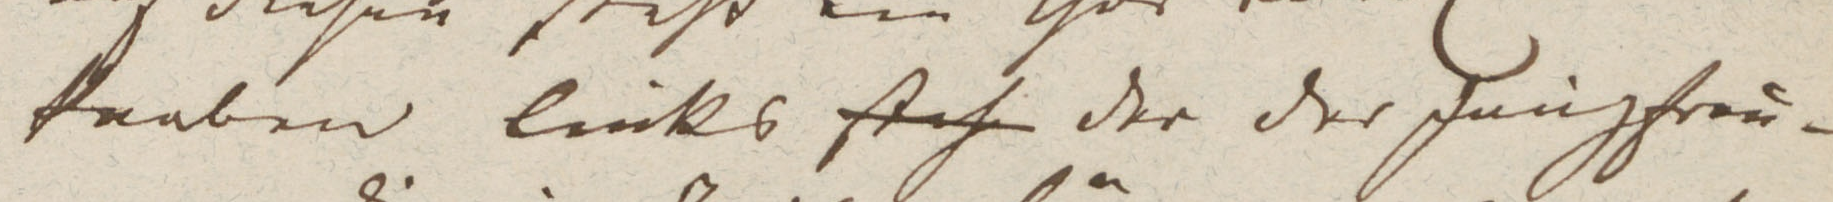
knaben links steh der der Jungfrau-
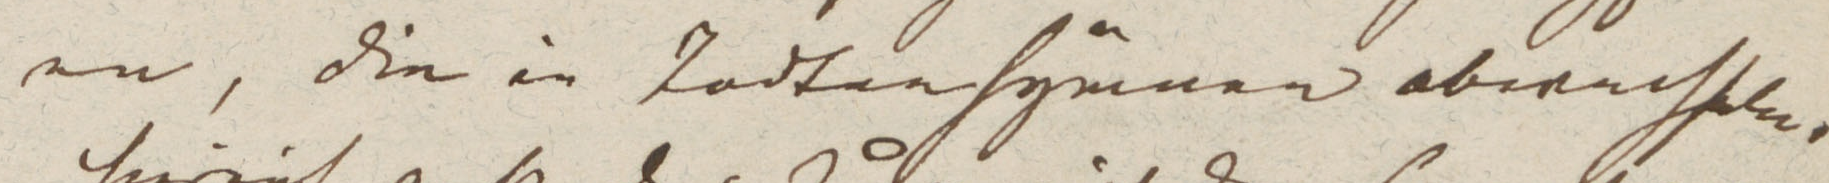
en, die in Todtenhymnen abwechseln.
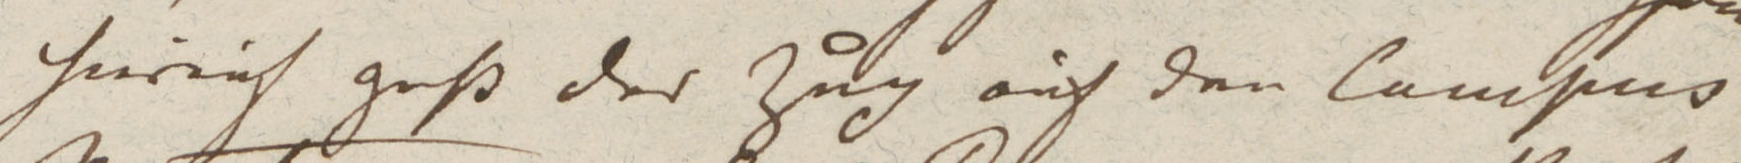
Hierauf geht der Zug auf den Campus
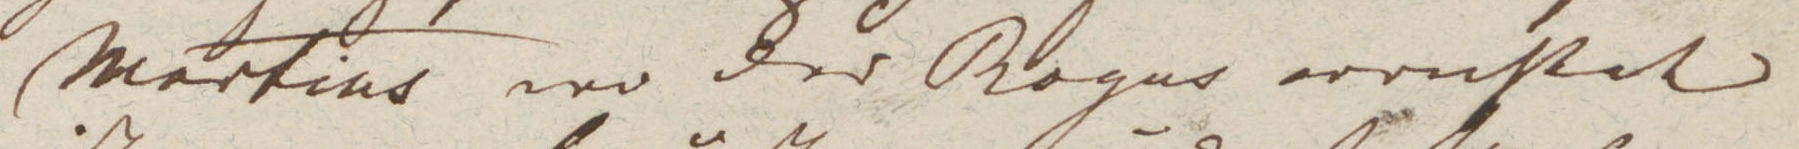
Martius wo der Rogus errichtet
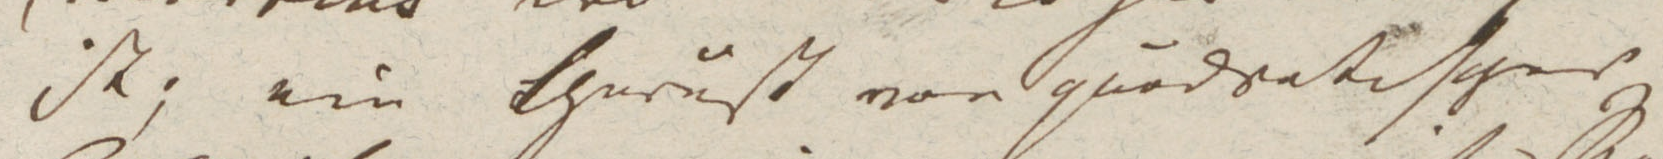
ist; ein Gerüst von quadratischer
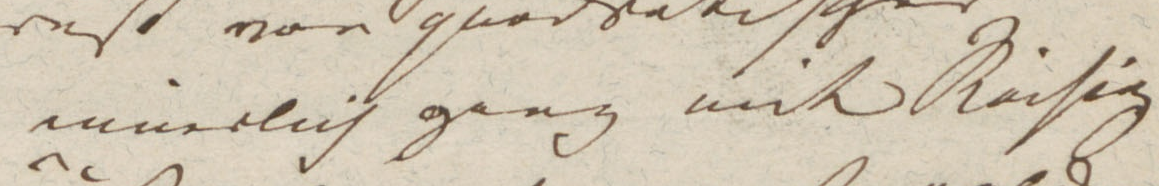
innerlich ganz mit Reisig
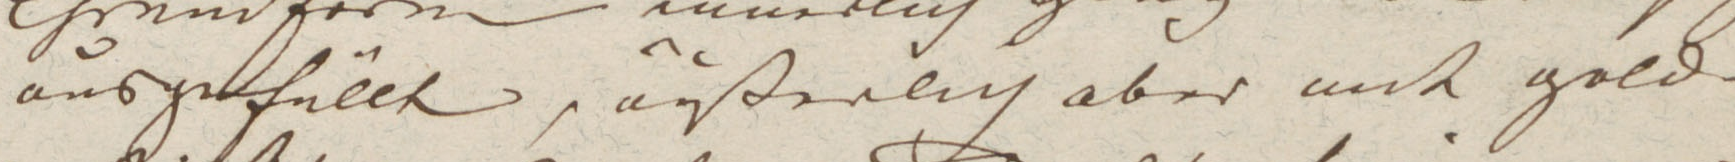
ausgefüllt, äusserlich aber mit gold-
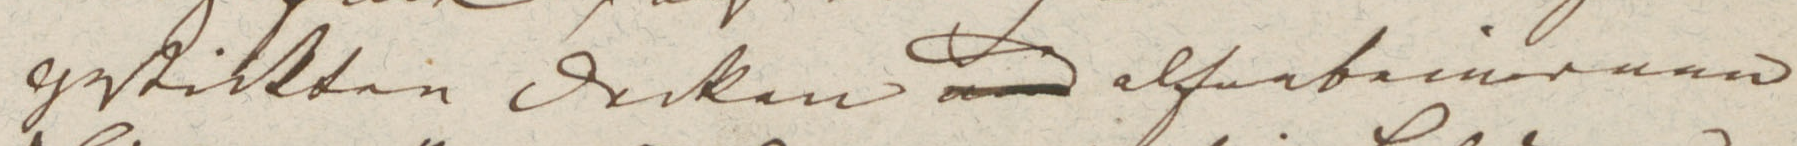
gestickten Decken und elfenbeinernen
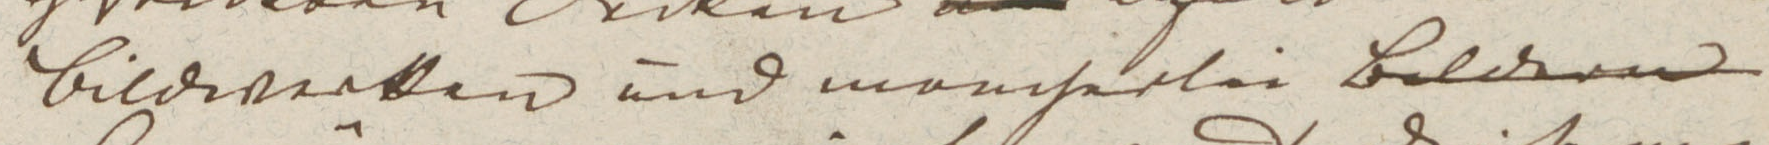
Bildwerken und mancherlei Bildern
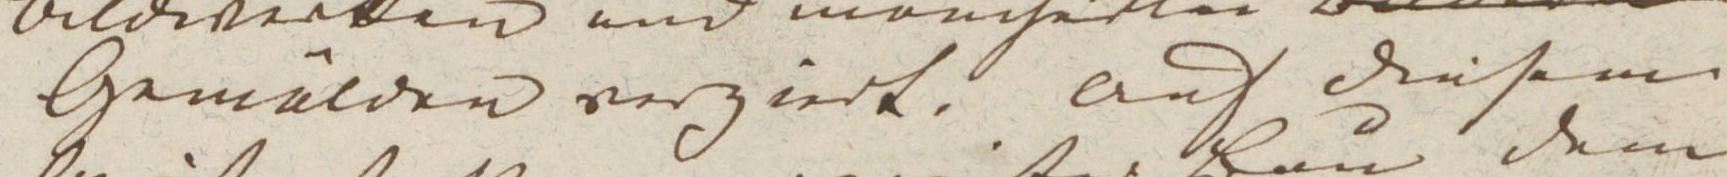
Gemälden verziert. Auf diesem
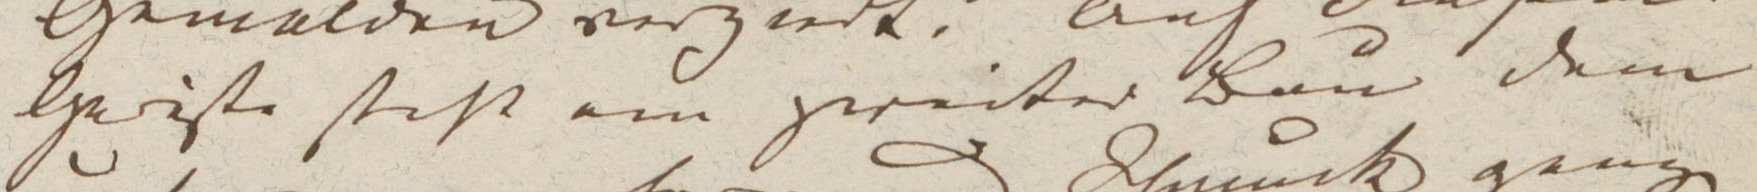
Gerüste steht ein zweiter Bau dem
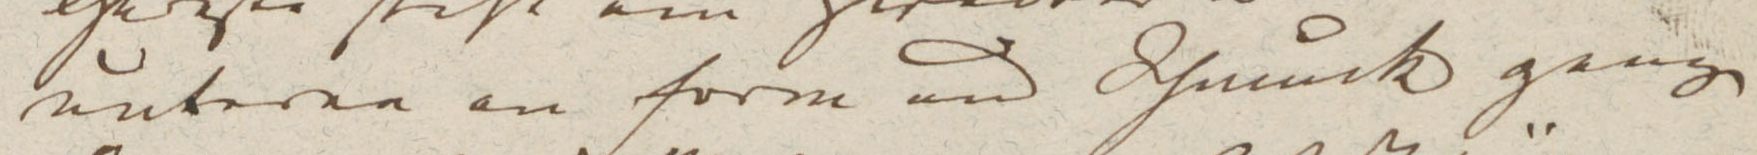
unteren an Form und Schmuck ganz
